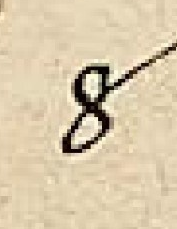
o
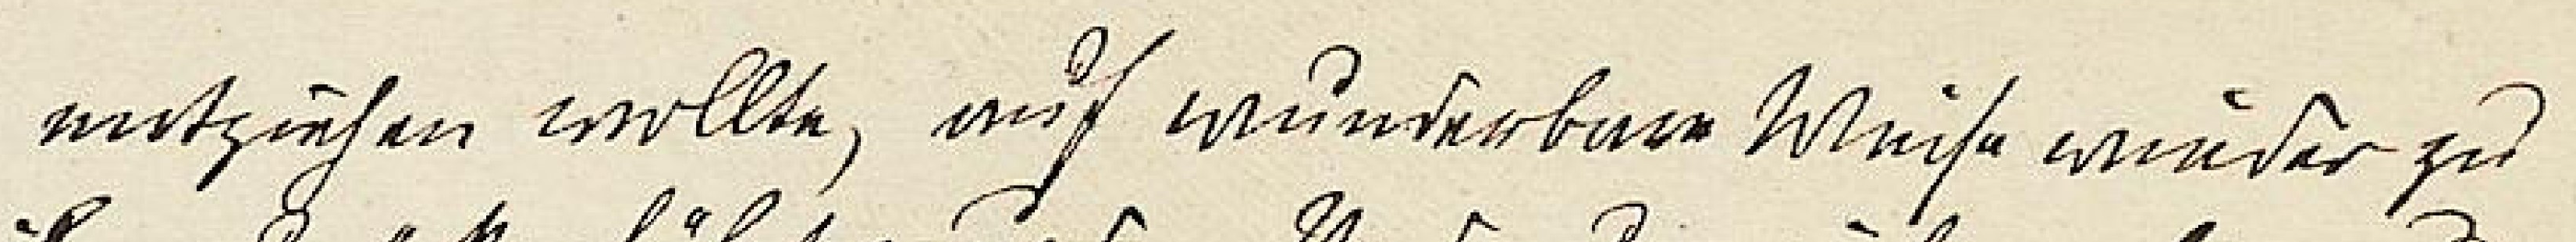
entziehen wollte, auf wunderbare Weise wieder zu
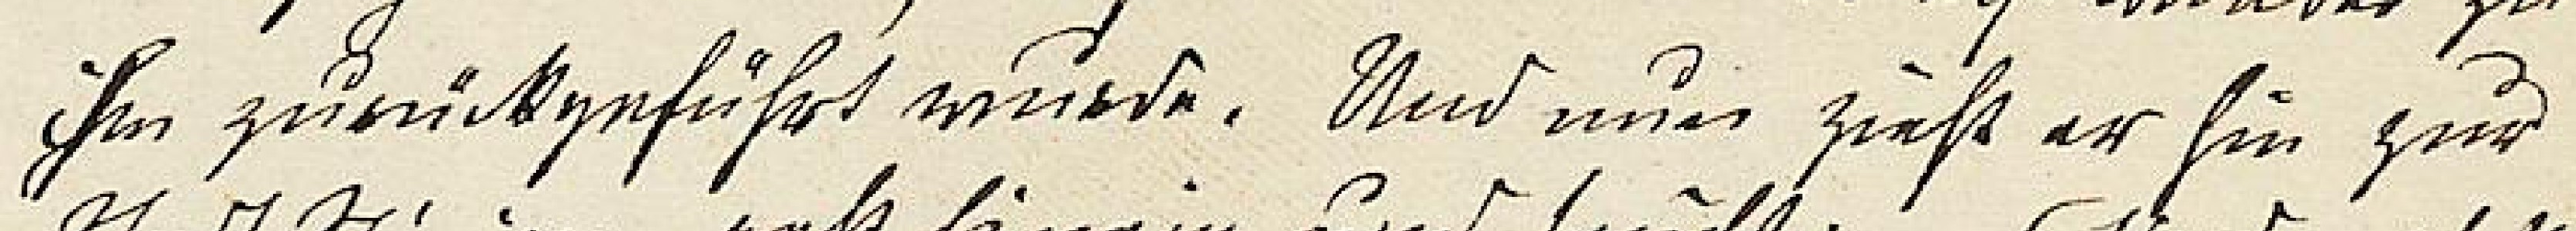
ihm zurückgeführt wurde. Und nun geht er hin zur
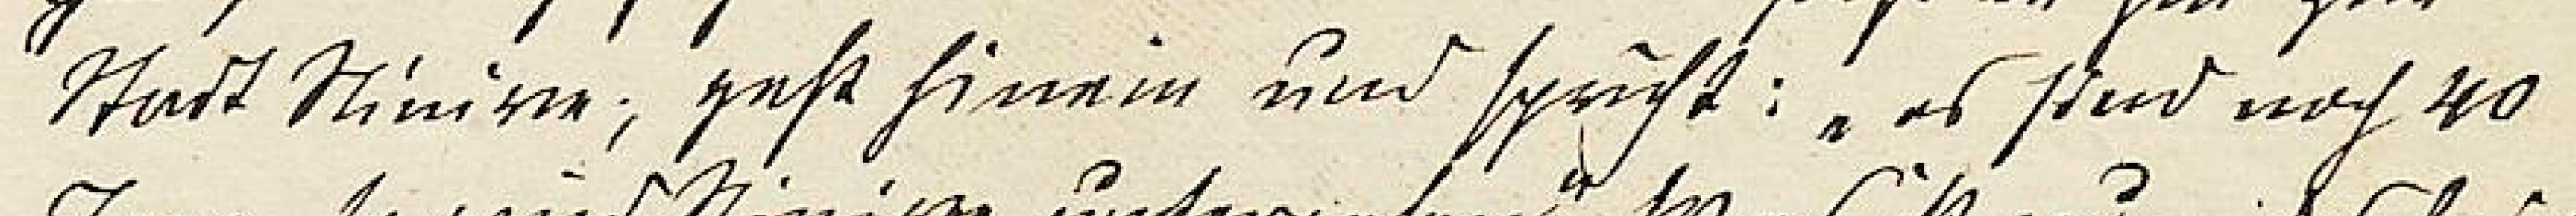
Stadt Ninive, geht hinein und spricht: "es sind noch 40
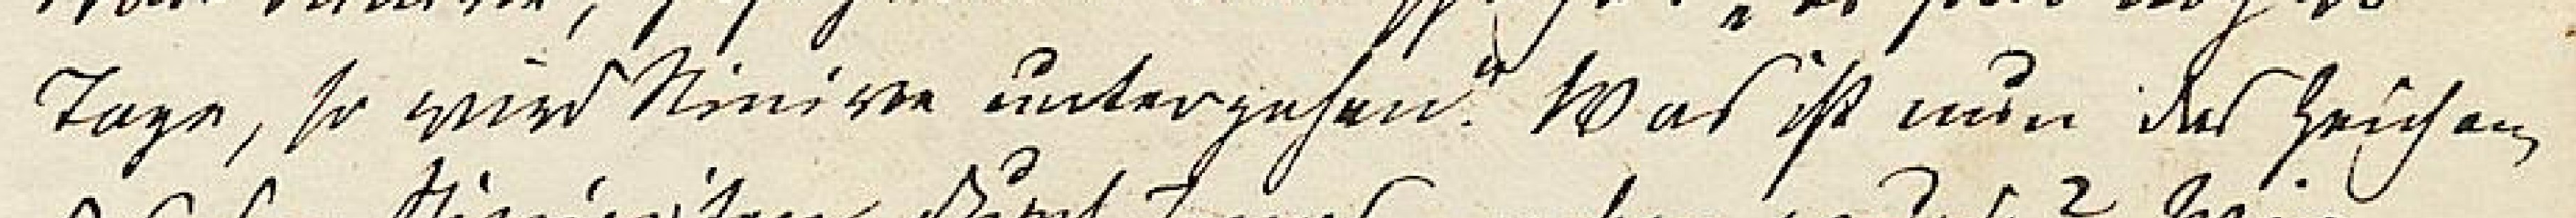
Tage, so wird Ninive untergehen." Was ist nun das Zeichen,
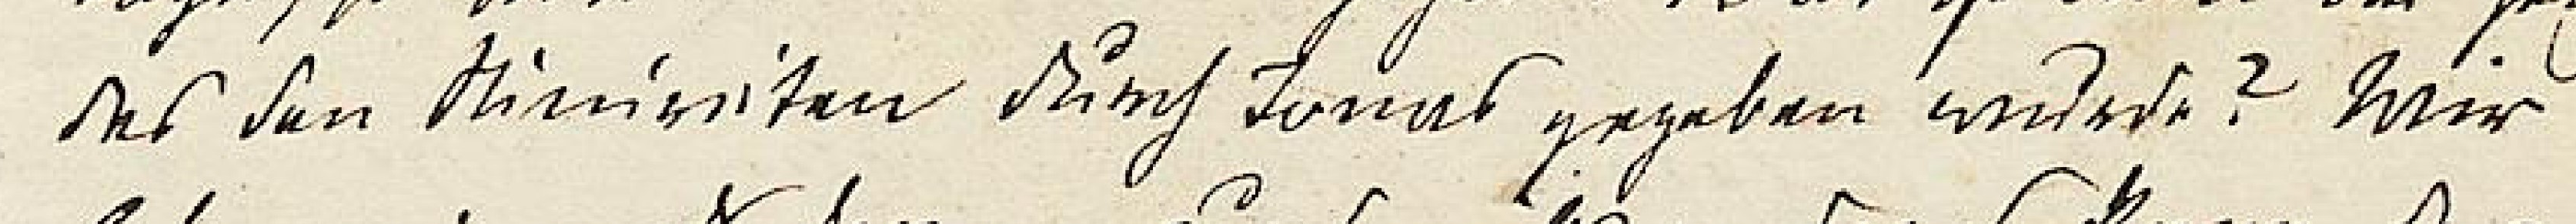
das den Niniviten durch Jonas gegeben wurde? Wir
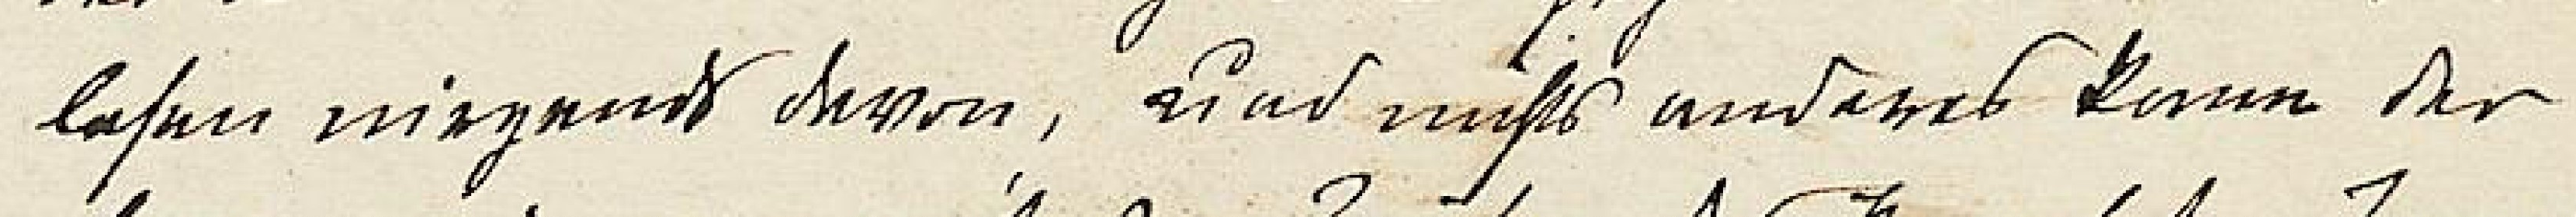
lesen nirgends davon, und nichts anderes kann der
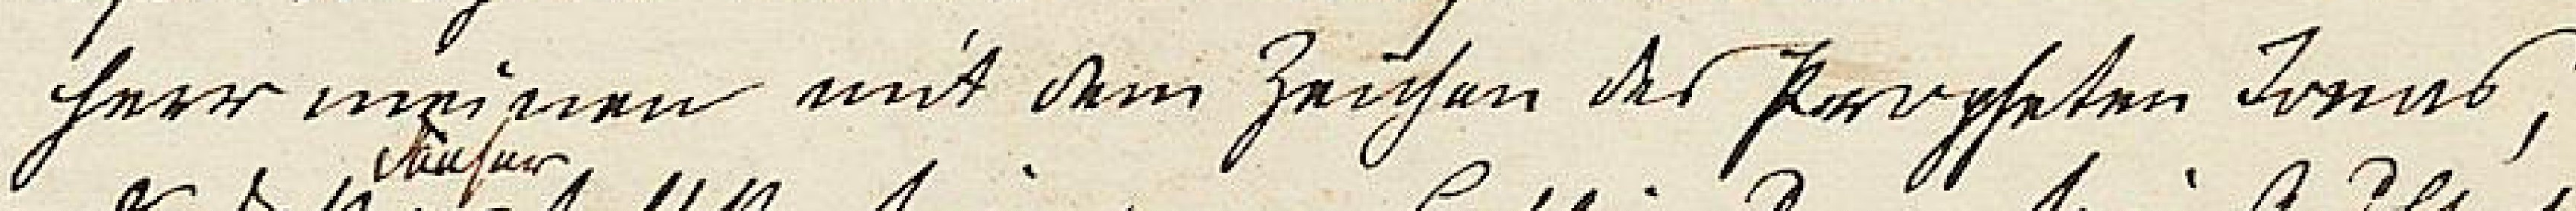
Herr meinen mit dem Zeichen des Propheten Jonas,
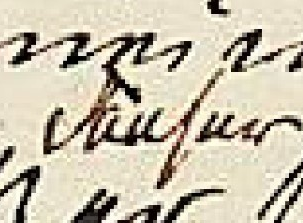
dieser
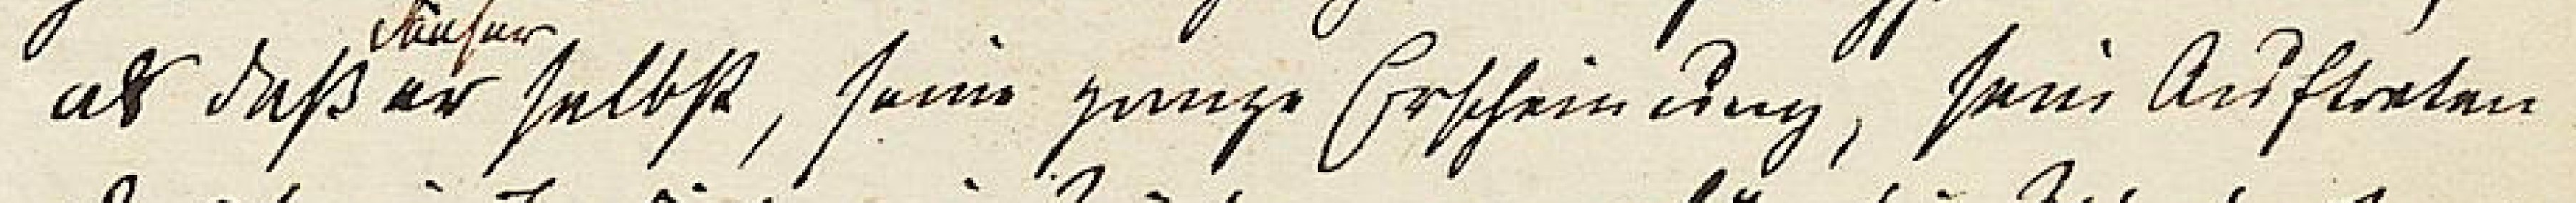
als daß er selbst, seine ganze Erscheinung, sein Auftreten
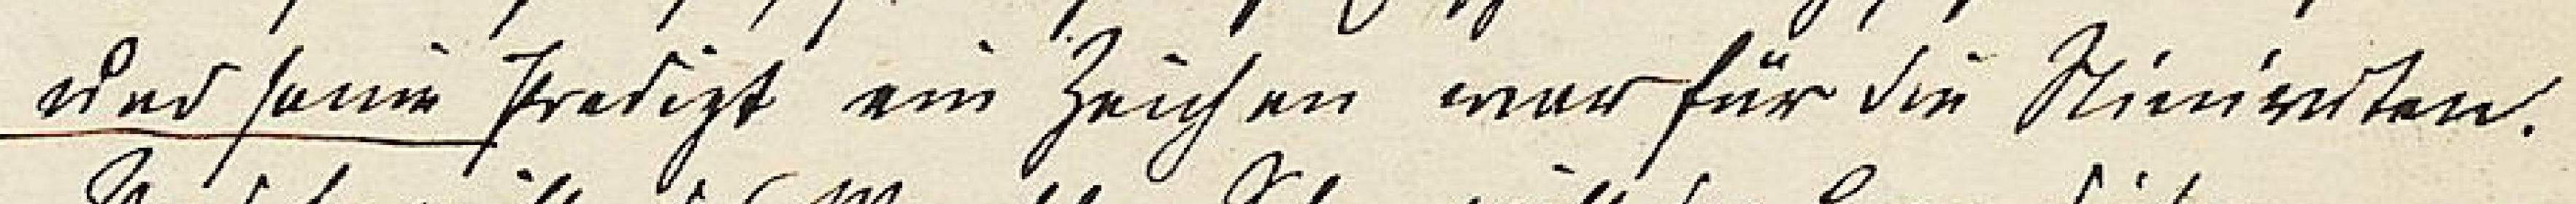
und seine Predigt ein Zeichen war für die Niniviten.
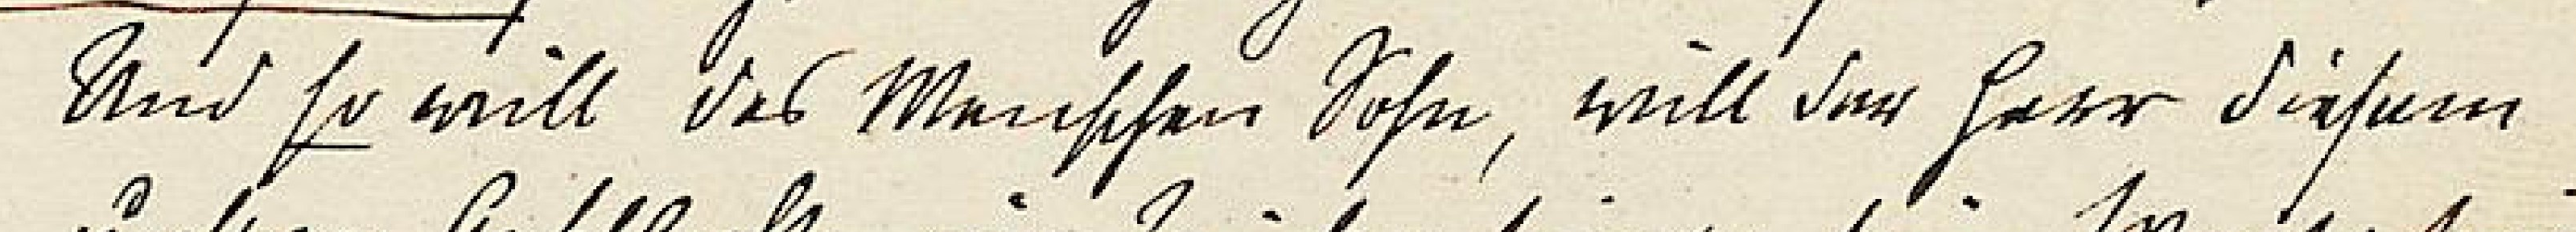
Und so will des Menschen Sohn, will der Herr diesem
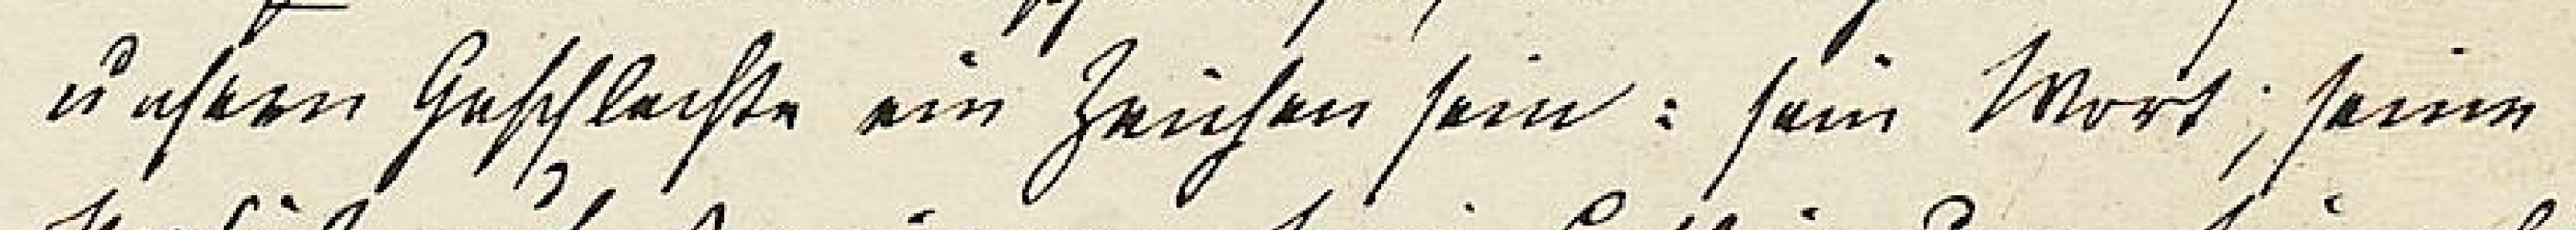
unserm Geschlechte ein Zeichen sein: sein Wort seine
